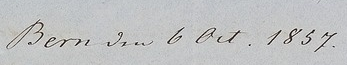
Bern den 6 Oct. 1857.
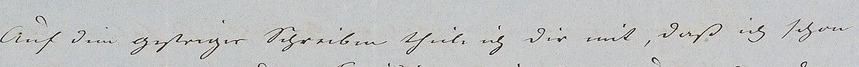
Auf dein gestriges Schreiben theile ich dir mit, dass ich schon
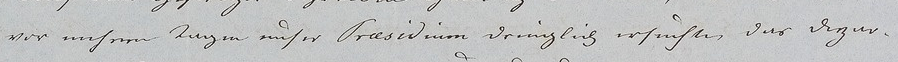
vor mehrern Tagen unser Præsidium dringlich ersuchte, das Depar-
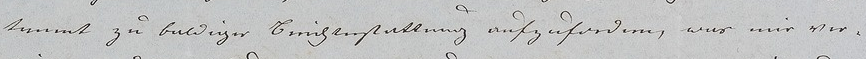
tement zu baldiger Berichterstattung aufzufordern, was mir ver-
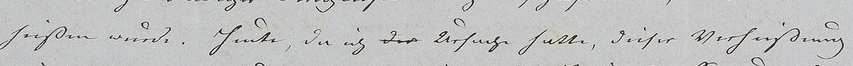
heißen wurde. Heute, da ich der Ursache hatte, dieser Verheißung
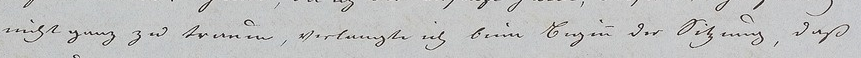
nicht ganz zu trauen, verlangte ich beim Beginn der Sitzung, daß
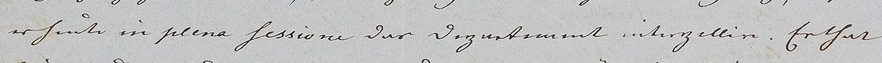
es heute in plena Sessione das Departement interpellire. Es that
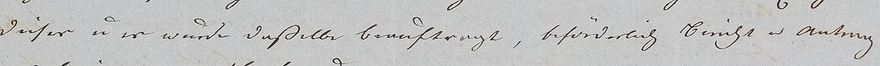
dieses u es wurde dasselbe beauftragt, beförderlich Bericht u Antrag
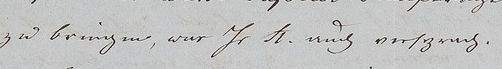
zu bringen, was Hr St. auch versprach.
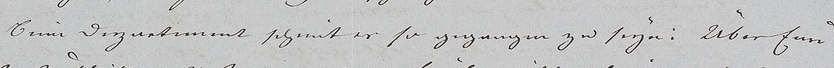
Beim Departement scheint es so gegangen zu seyn: Über Eure
